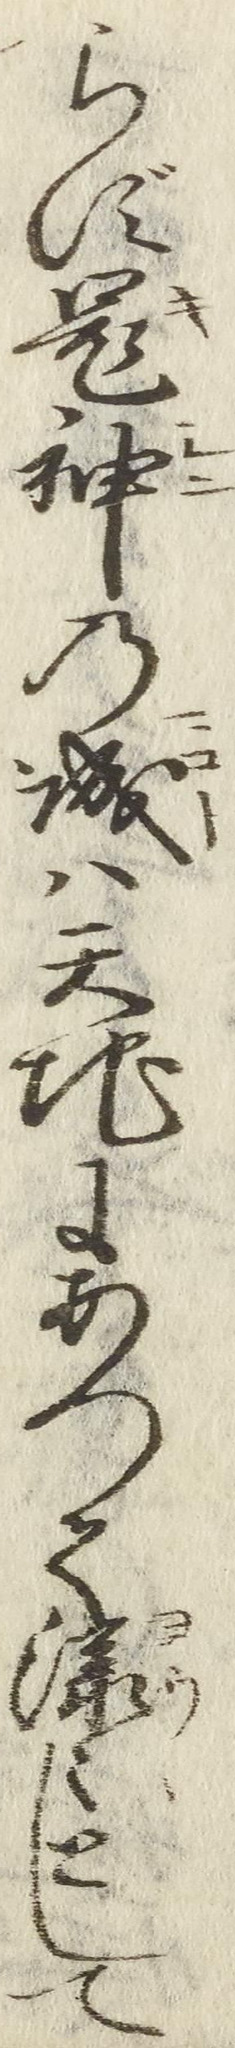らず鬼神の誠は天地にあつて漾々として
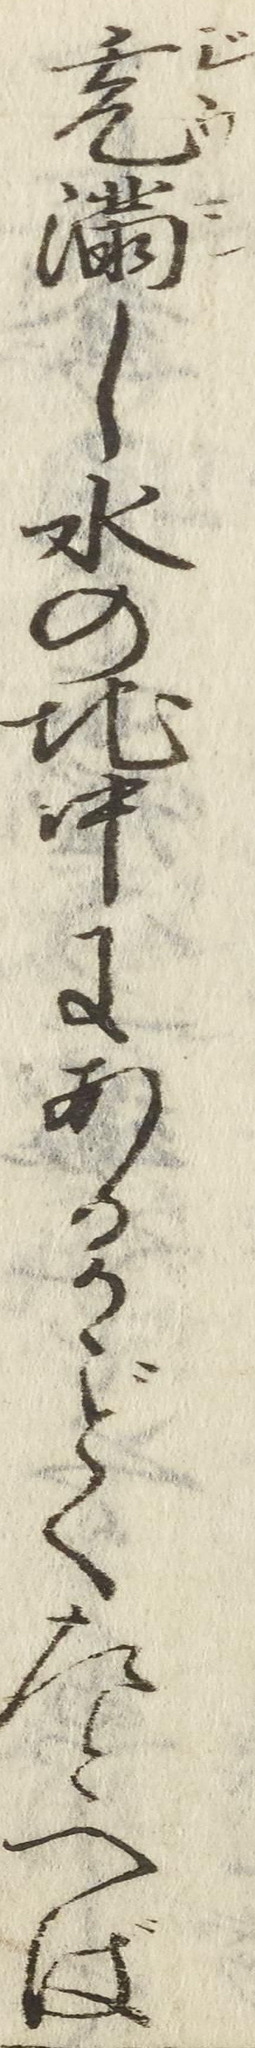充満し水の地中にあるかごとくたとへば
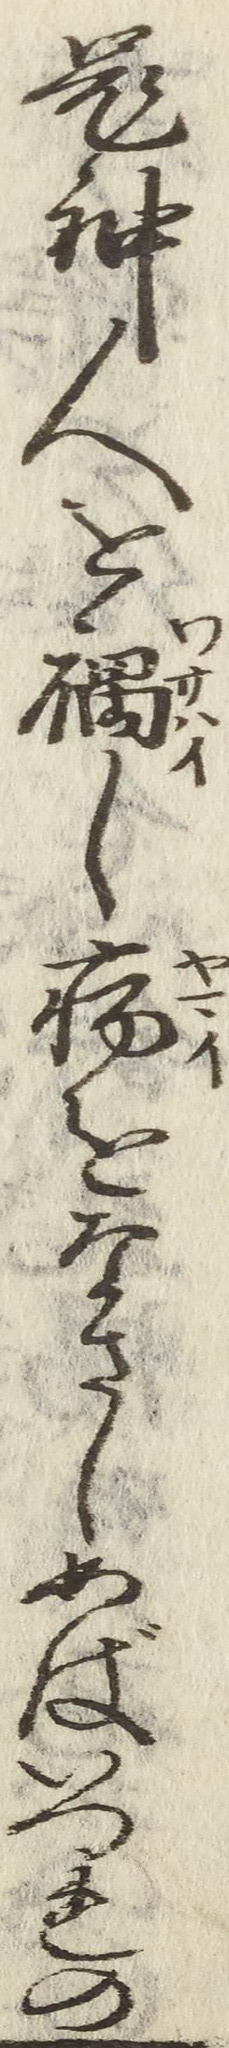鬼神人を禍し病をなさしめばいつれの
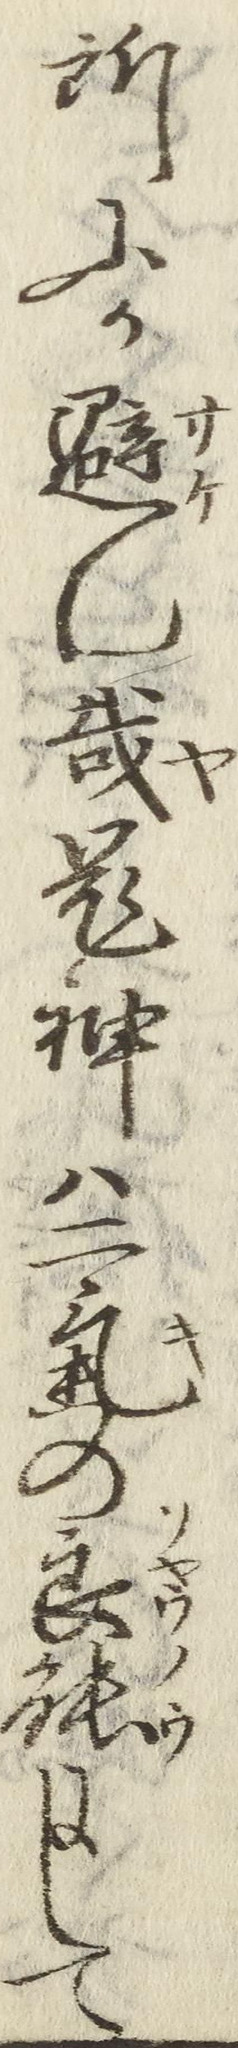所にか避ん哉鬼神は二気の良能にして
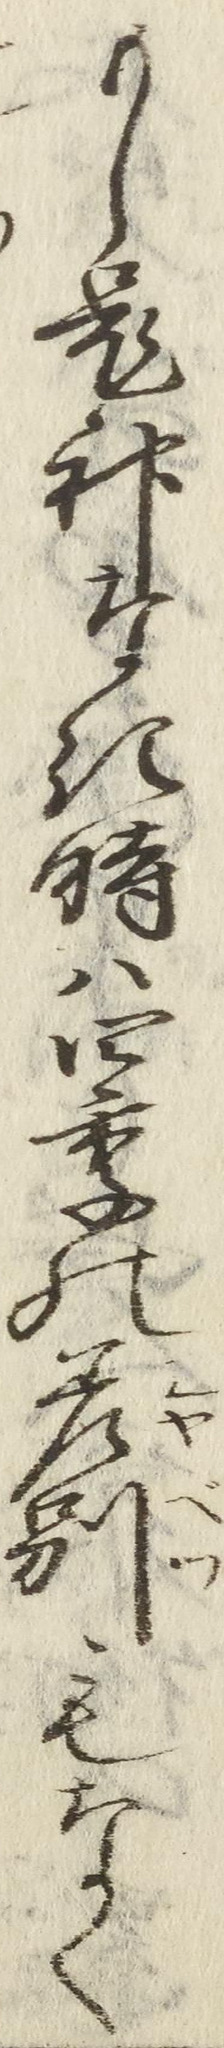もし鬼神なき時は四季の差別もなく
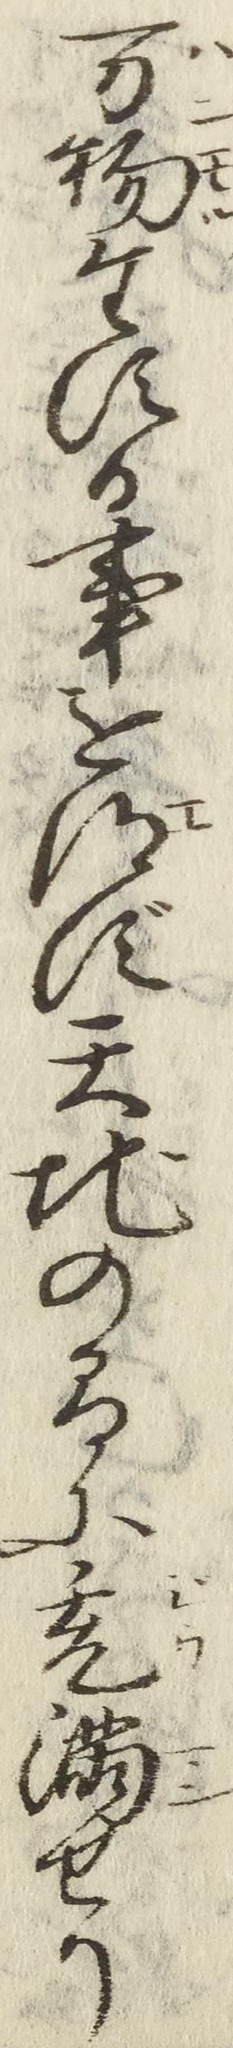万物生する事を得ず天地の間に充満せり
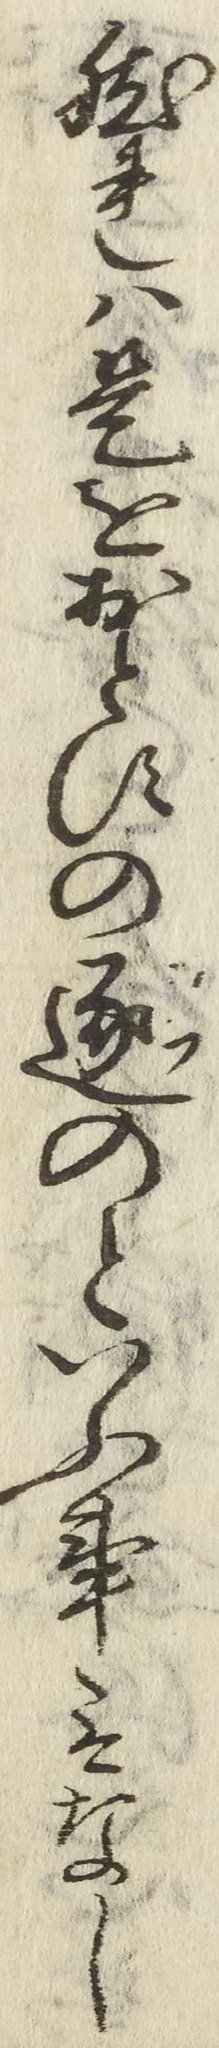然れは是をおとすの逐のといふ事はなし

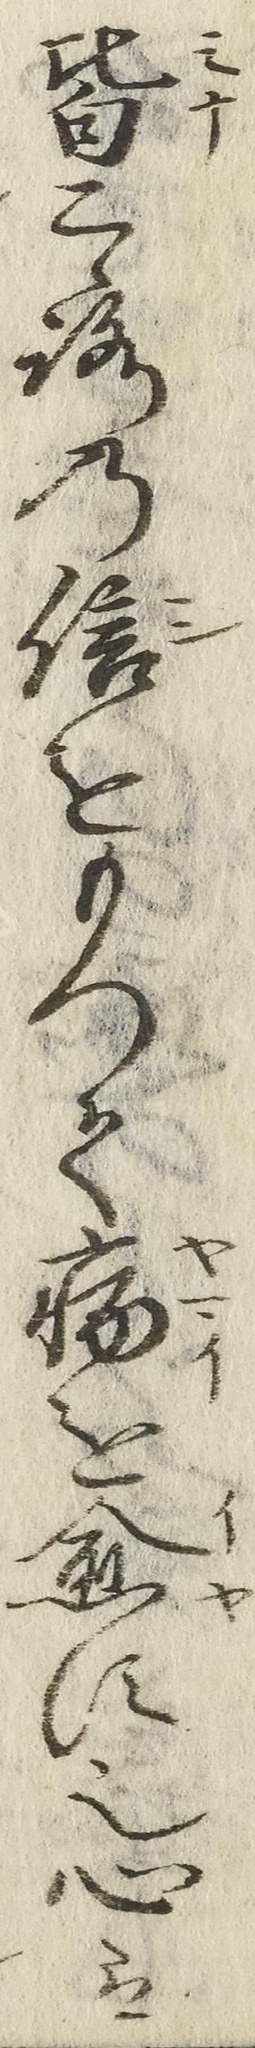皆こゝろの信をもつて病を愈す也心は
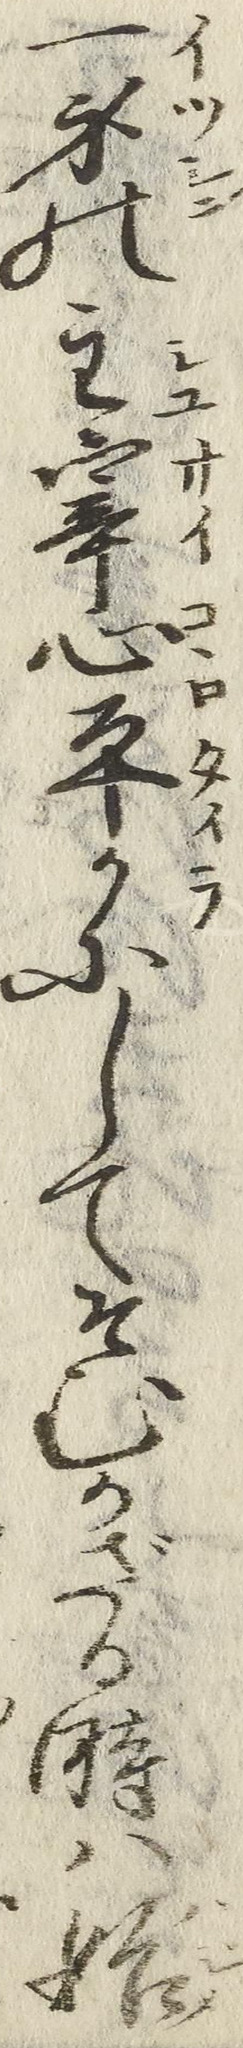一身の主宰心平かにしてそむかざる時は始
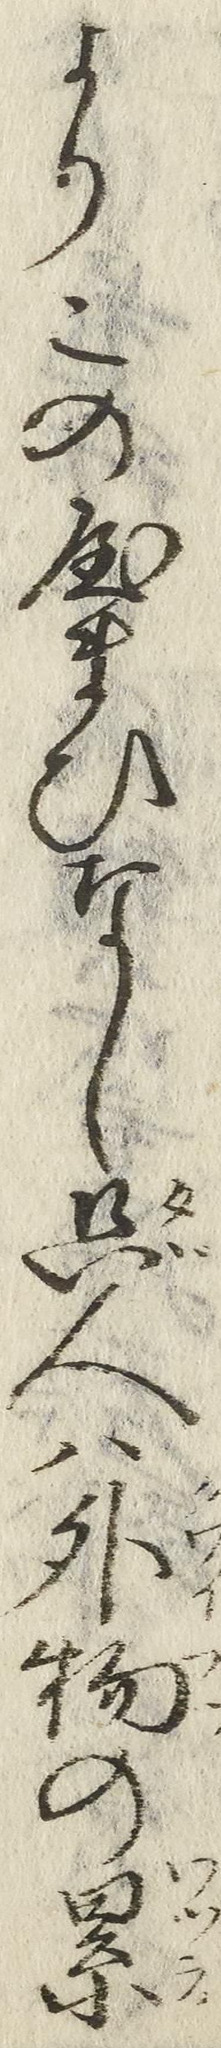よりこのやまひなし只人は外物の累
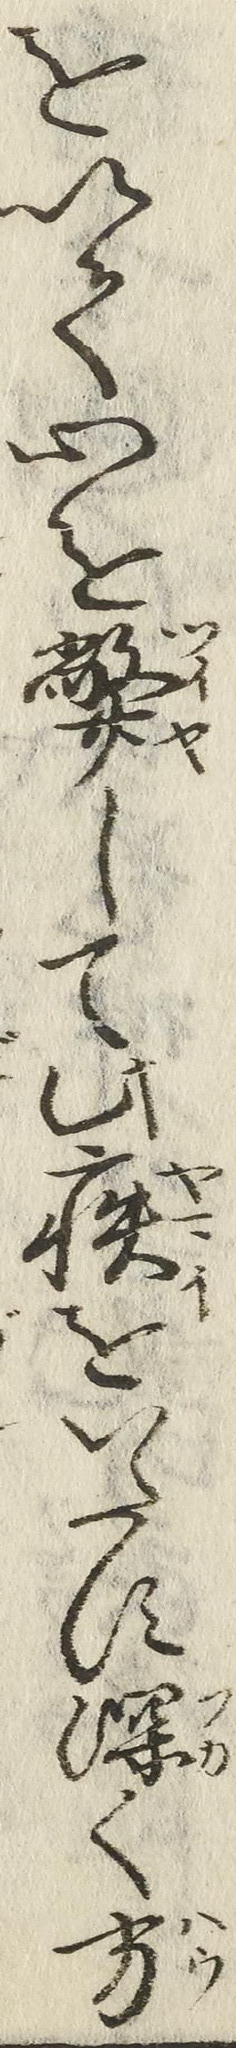を以て心を弊して此病をいたす深く方
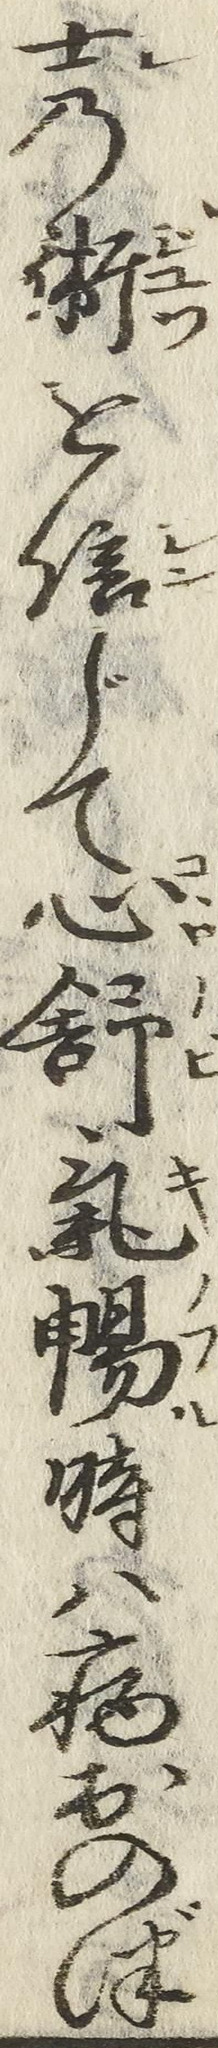士の術を信じて心舒気暢時は病おのづ
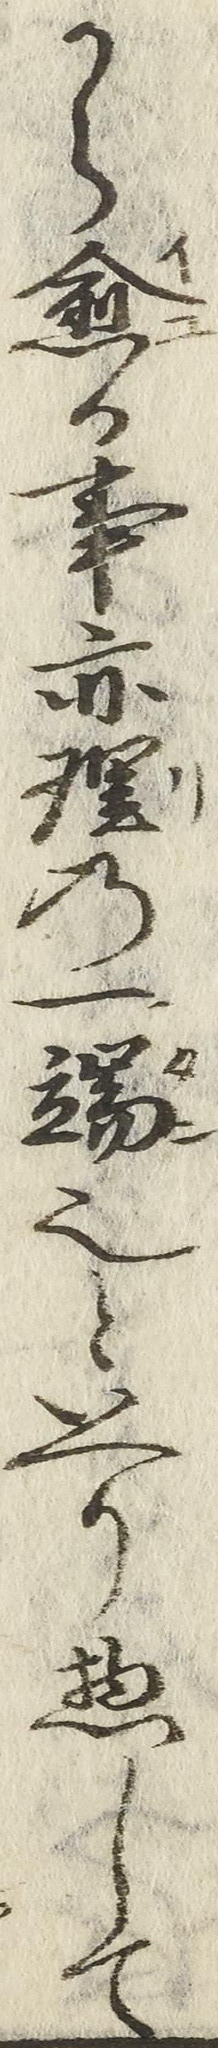から愈る事亦理の一端也といへり惣して
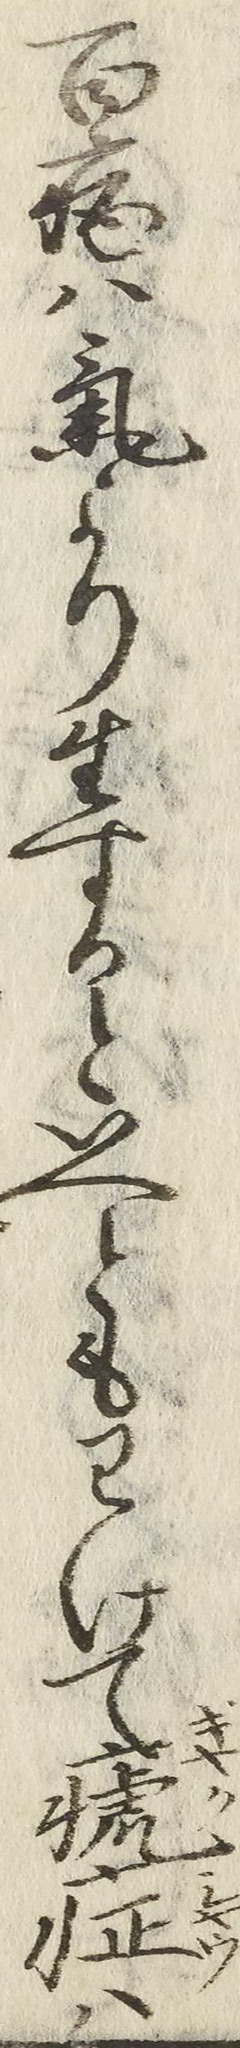百病は気より生するといへともわけて瘧症は
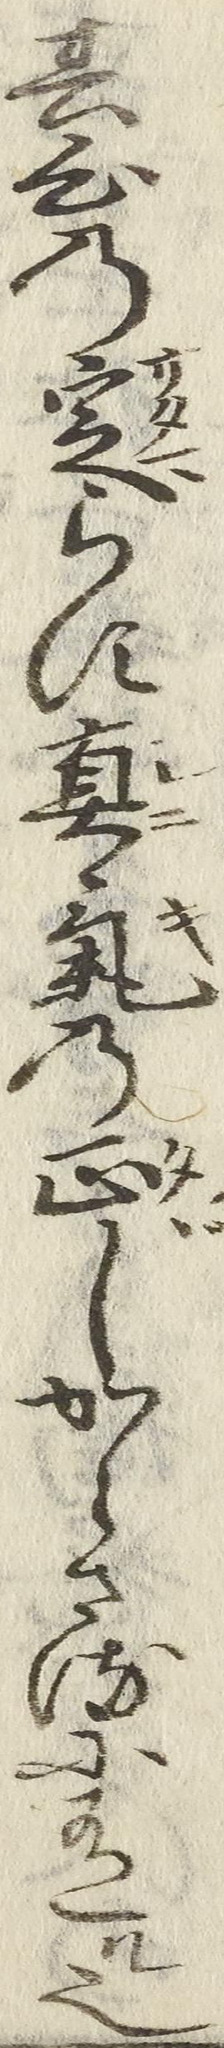其心の定らす真気の正しからさるに有ル也
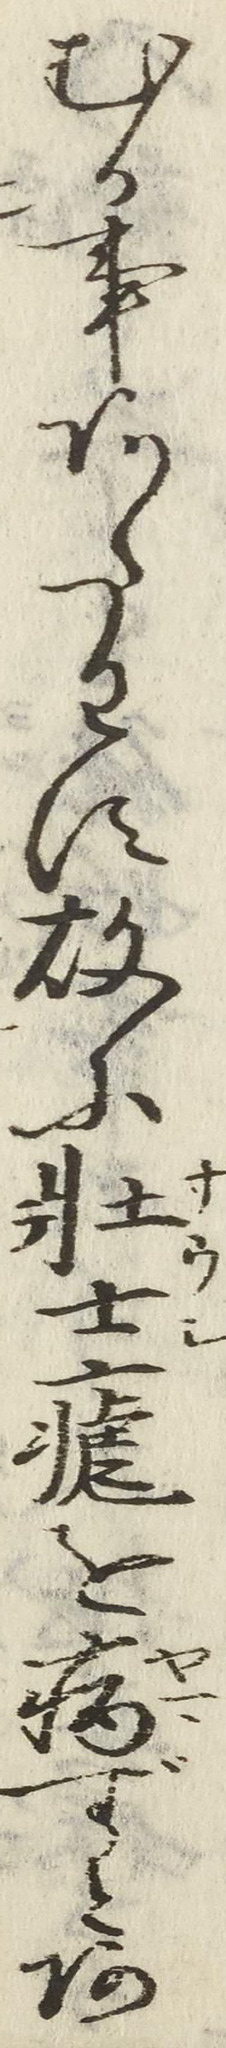むる事あたわす故に壮士瘧を病ずとあ
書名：天地或問珍　地
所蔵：東京大学地震研究所図書室 Earthquake Research Institute Library, The University of Tokyo, JAPAN
